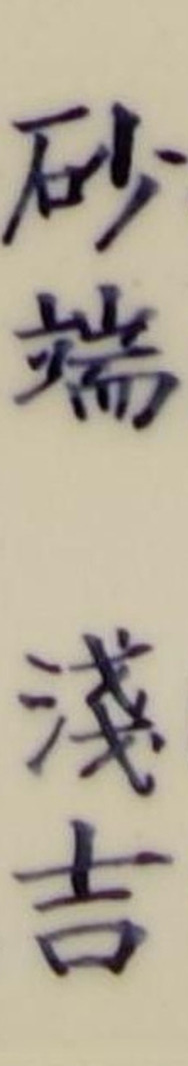砂端浅吉
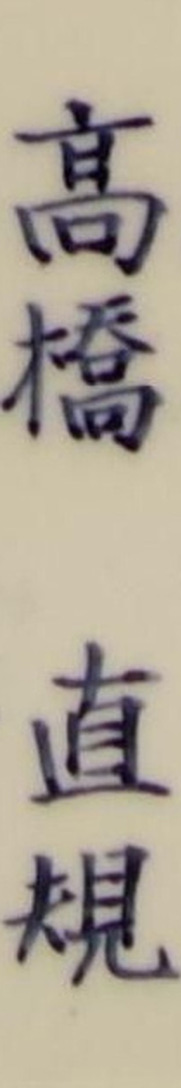高橋直規
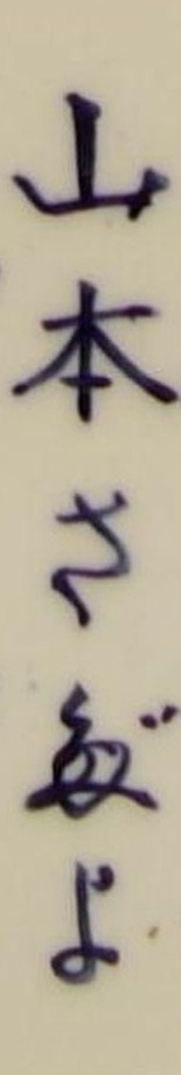山本さだよ
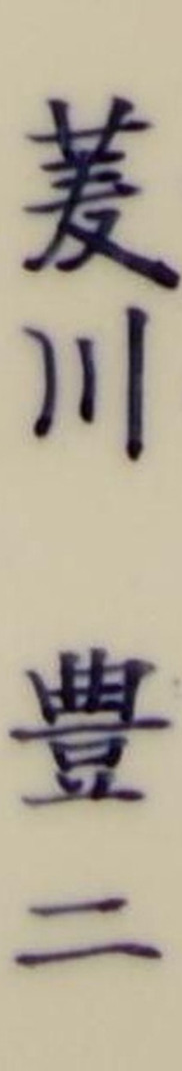菱川豊二
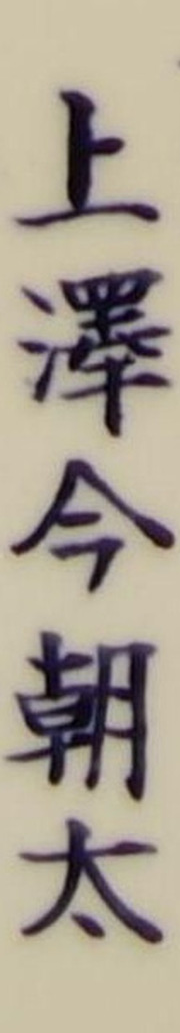上澤今朝太
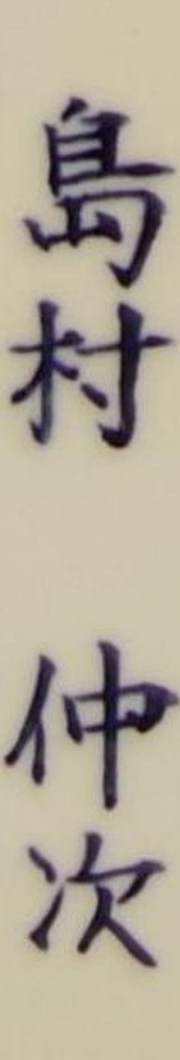島村仲次
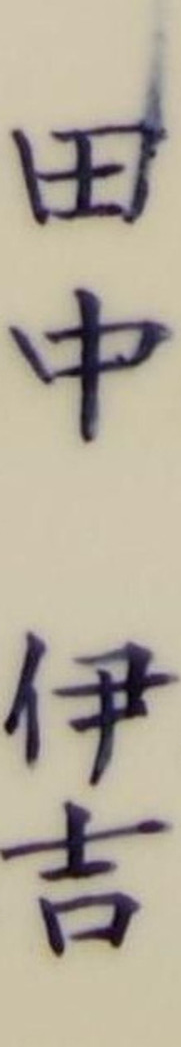田中伊吉
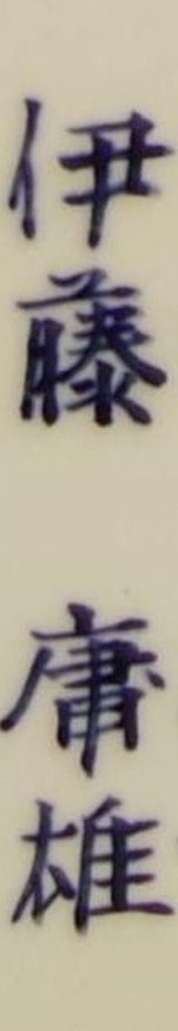伊藤庸雄
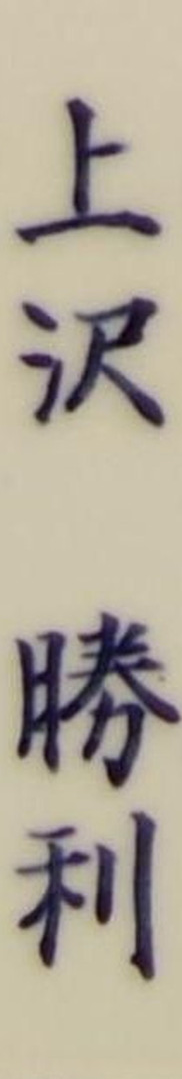上沢勝利
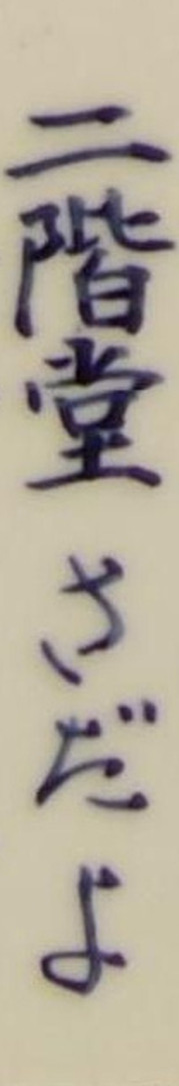二階堂さだよ
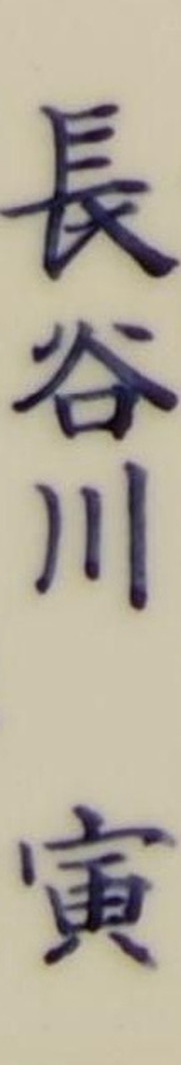長谷川寅
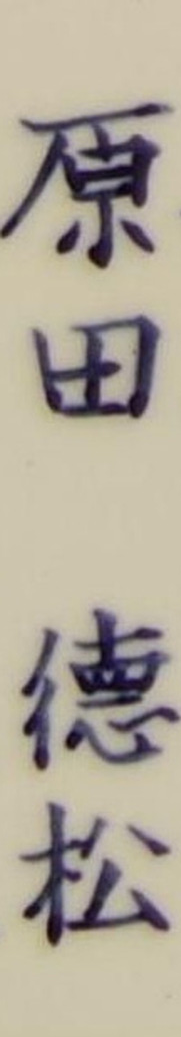原田徳松
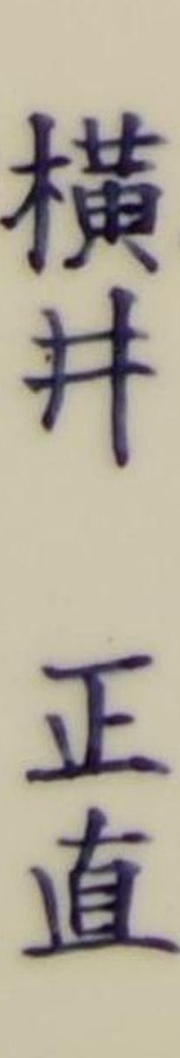横井正直
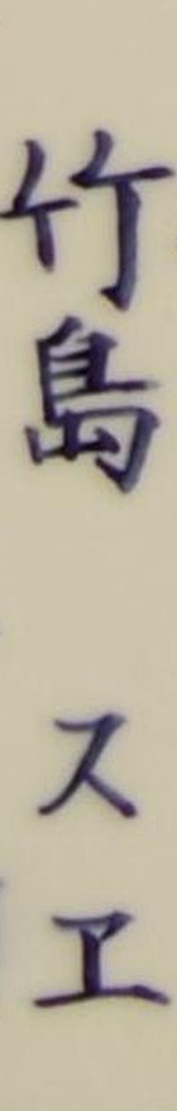竹島スヱ
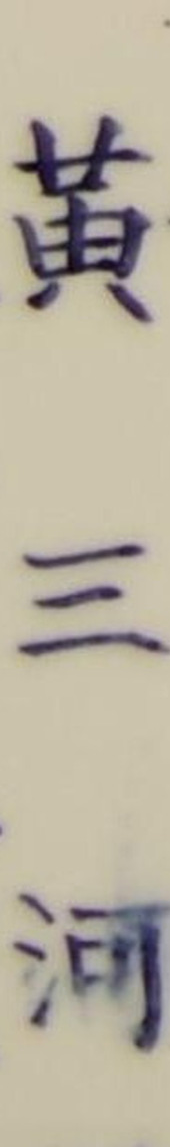黄三河
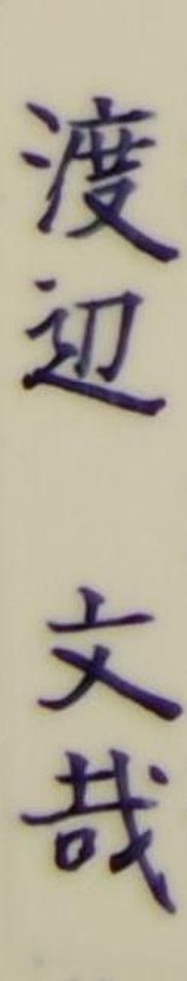渡辺文哉
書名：A~D
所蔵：koyasan kongobuji
